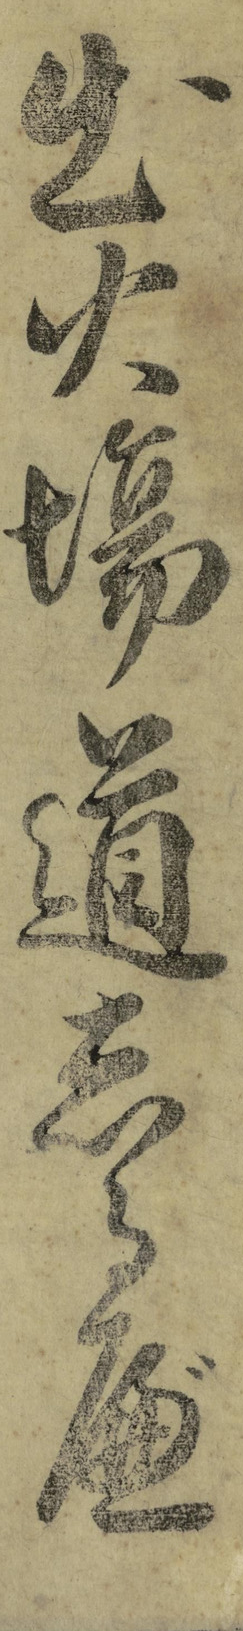出火場道しるべ
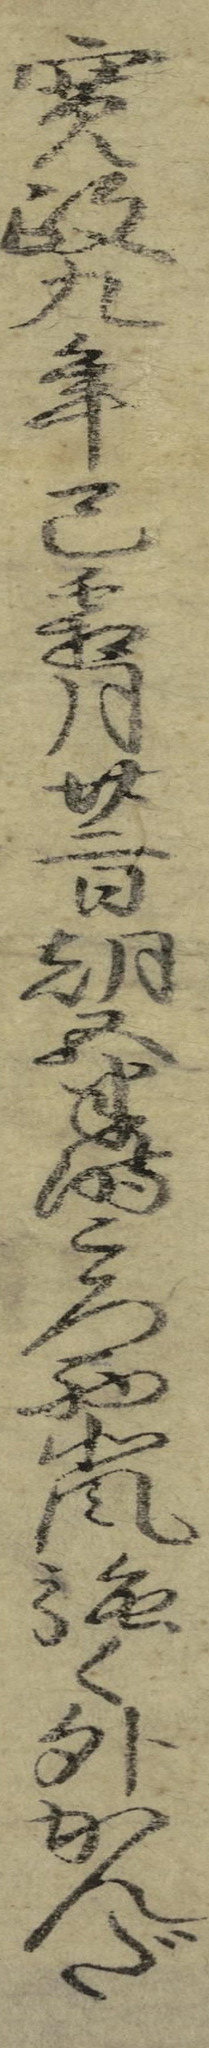寛政九年巳霜月廿二日朝五半時ころ西北風強く外かんだ
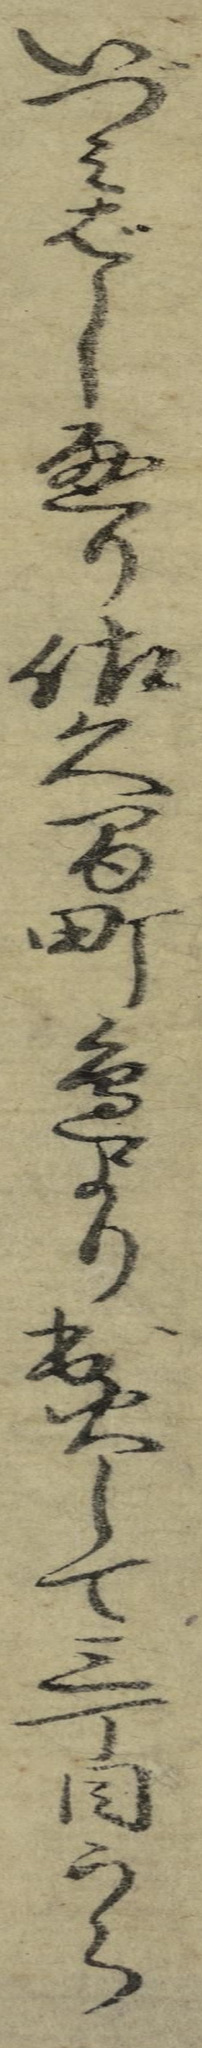いづみばしへり佐久間町辺より出火して三丁目うら
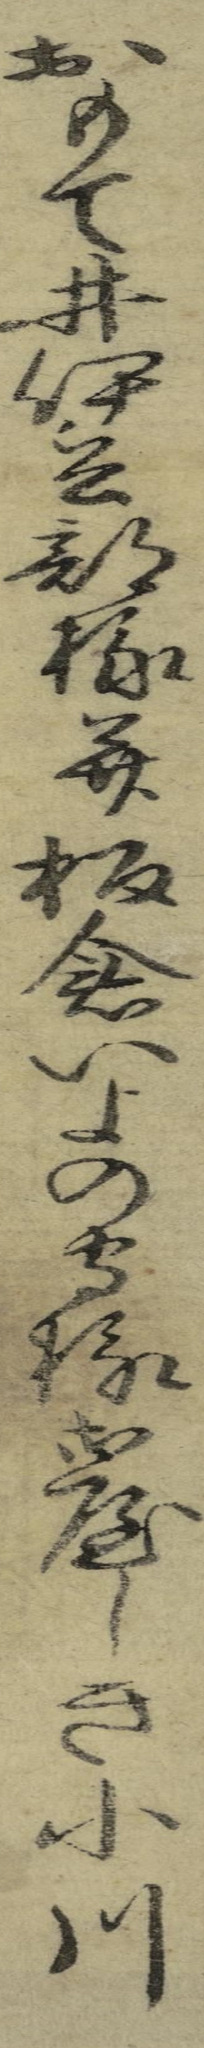おもて井伊兵部様并板倉いよの守様御屋しき小川
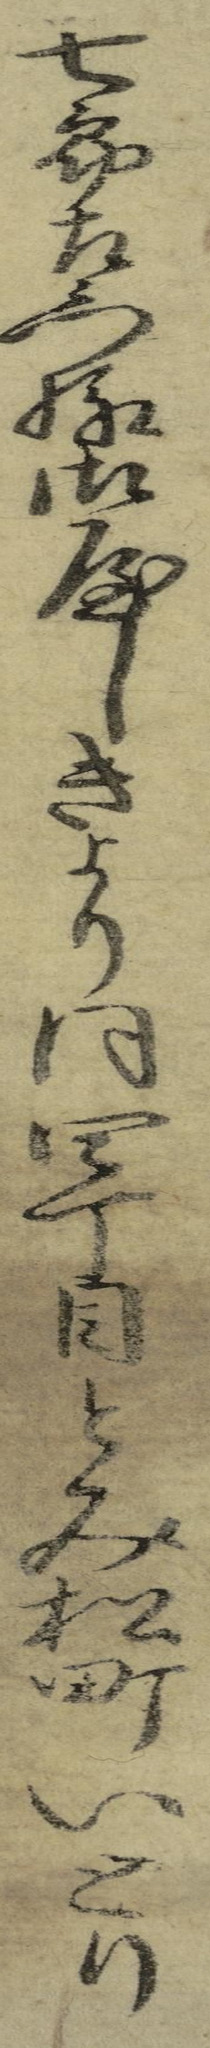七郎左衛門様御屋しきより同四丁目とみ松町いとり
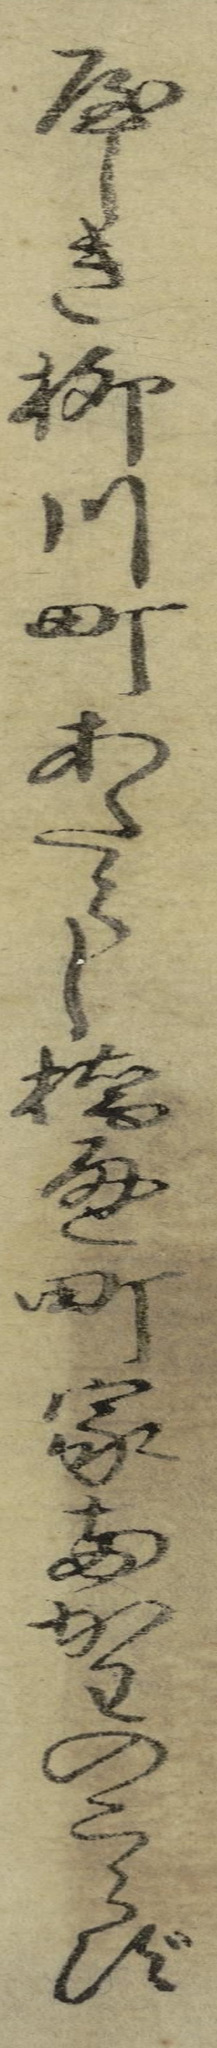屋しき柳川町あたらし橋通町家両かわのこらず
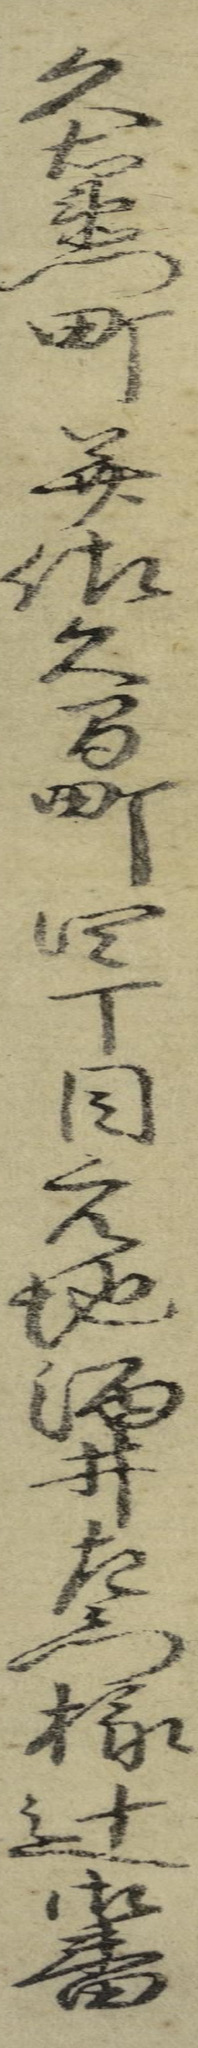久右衛門町并佐久間町四町目元地酒井左衛門様辻御番
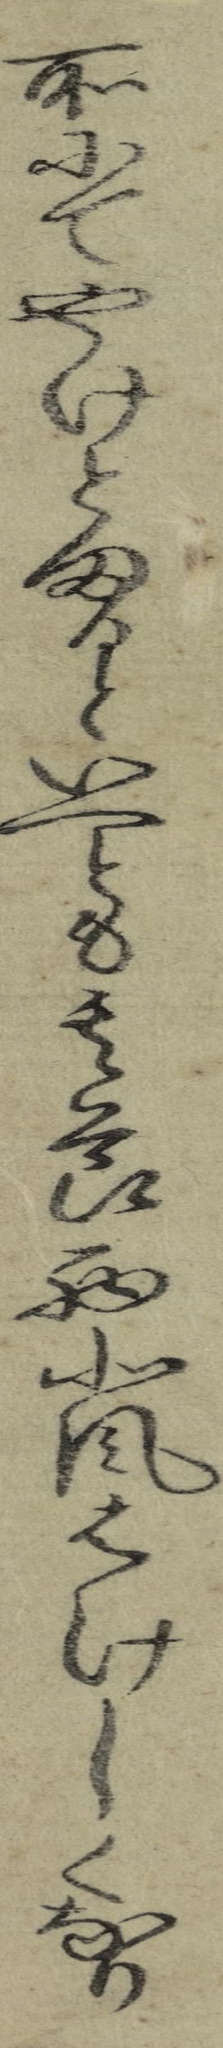所にてやけとまるといへとも其節西北風はけしくなり
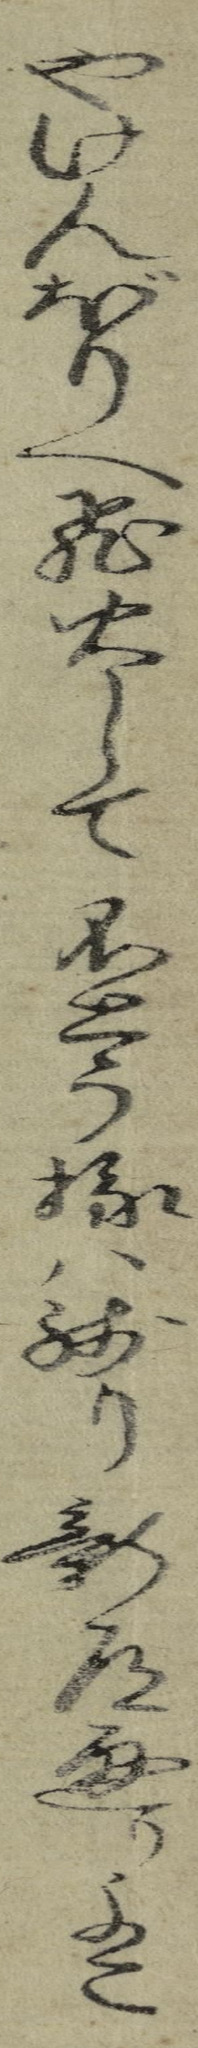やけんぼりへ飛火してふとう様ハ残り新道通りよこ
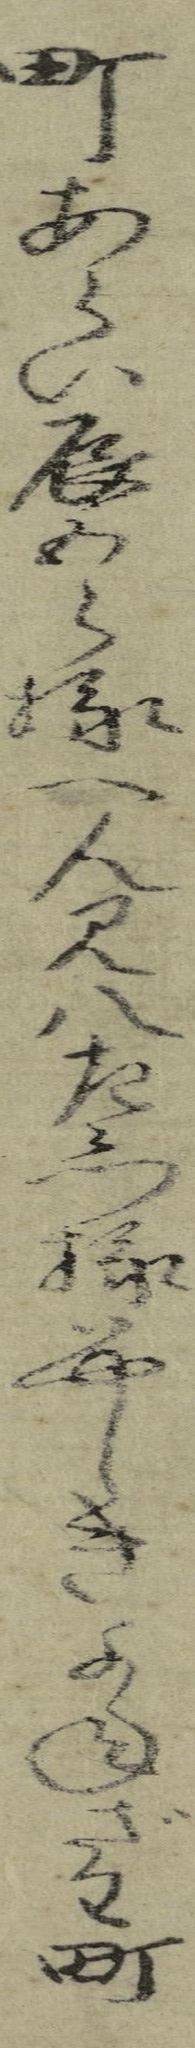町あらい辰五郎様へんみ八左衛門様やしきよねざわ町
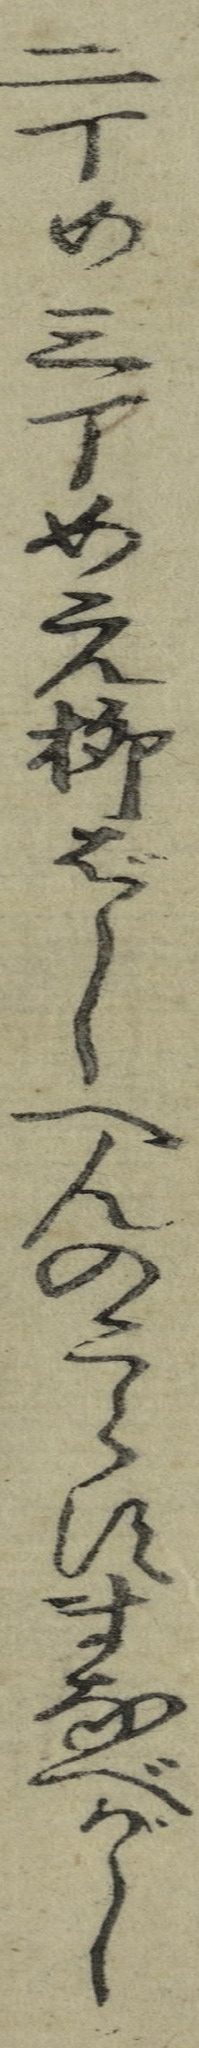二丁め三丁め元柳ばしへんのこらすまなべがし
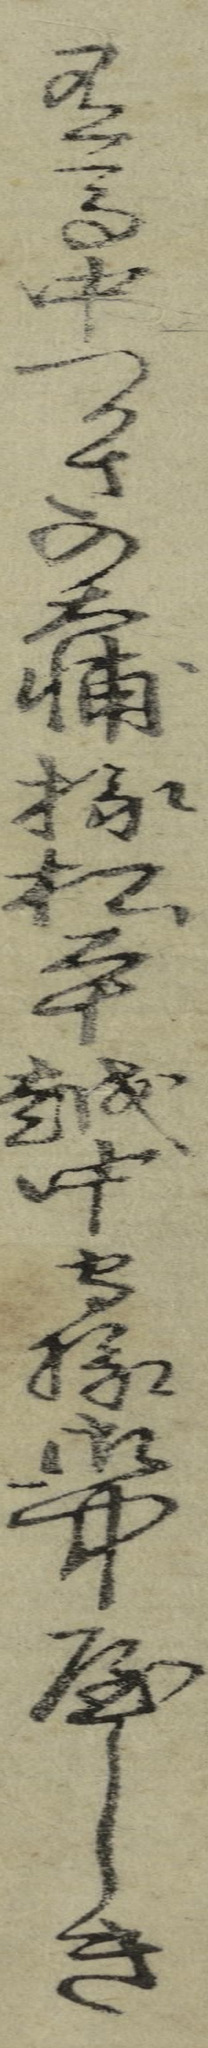有馬中つかさの大輔様松平越中守様御中屋しき
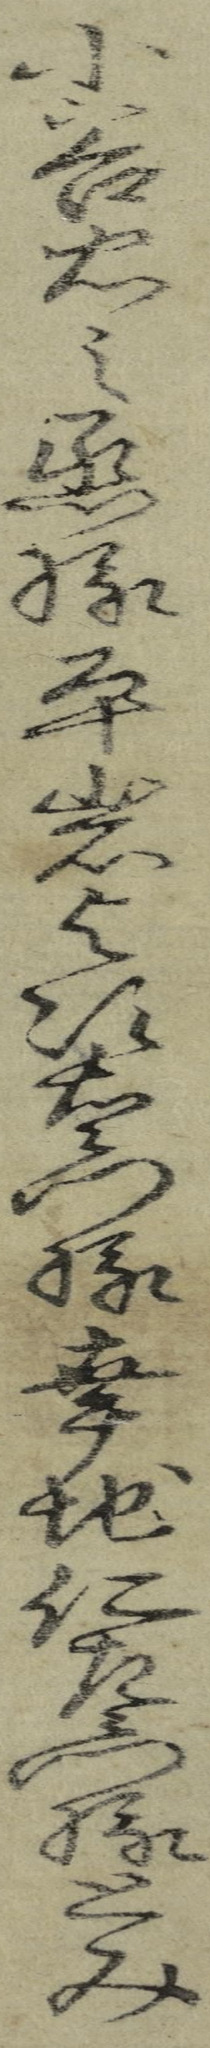小谷忠之丞様平岩与次右衛門様幸地仁左衛門様とみ
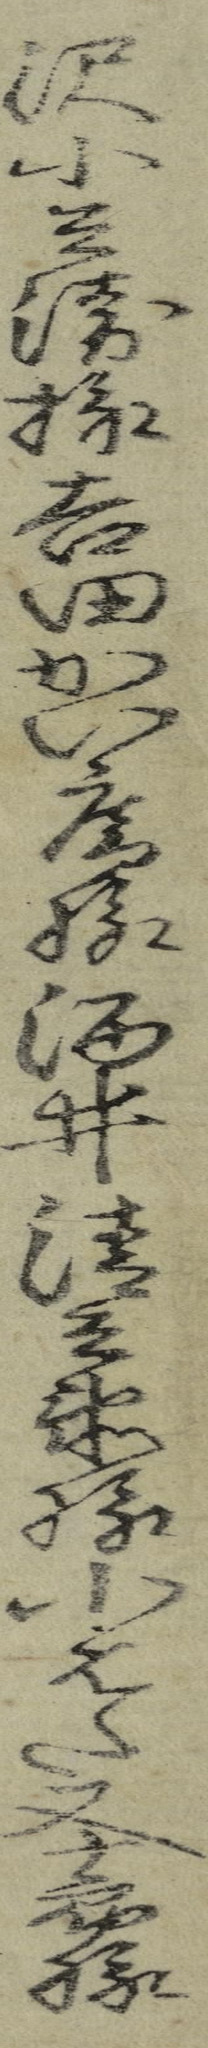沢小兵衛様吉田かい麿様酒井清兵衛様小はた叉十郎様
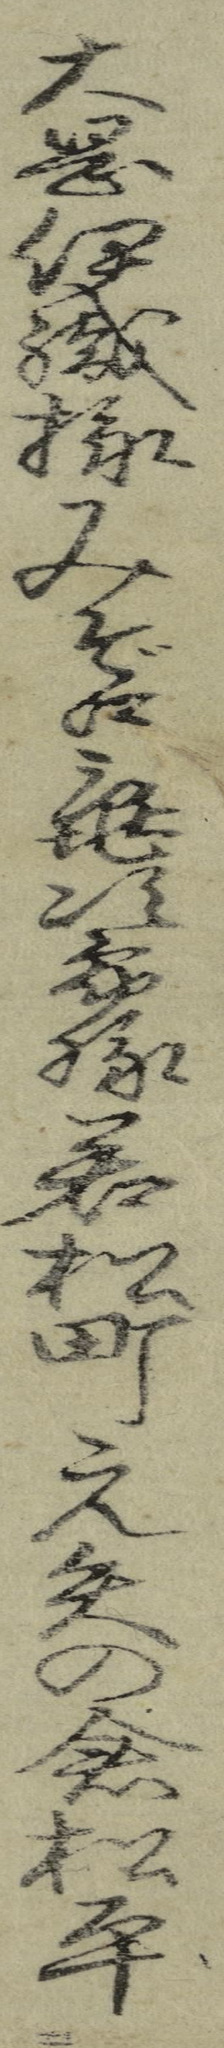大岡伊織様みぞ口亀次郎様若松町元矢の倉松平
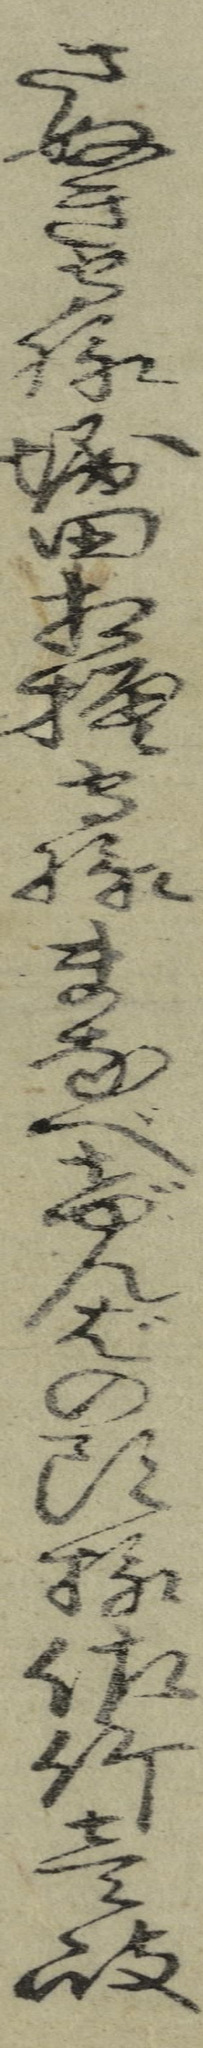さぬき守様堀田相模守様まなべげんばの頭様佐竹壱岐
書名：出火場道しらべ
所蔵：東京大学地震研究所図書室 Earthquake Research Institute Library, The University of Tokyo, JAPAN
